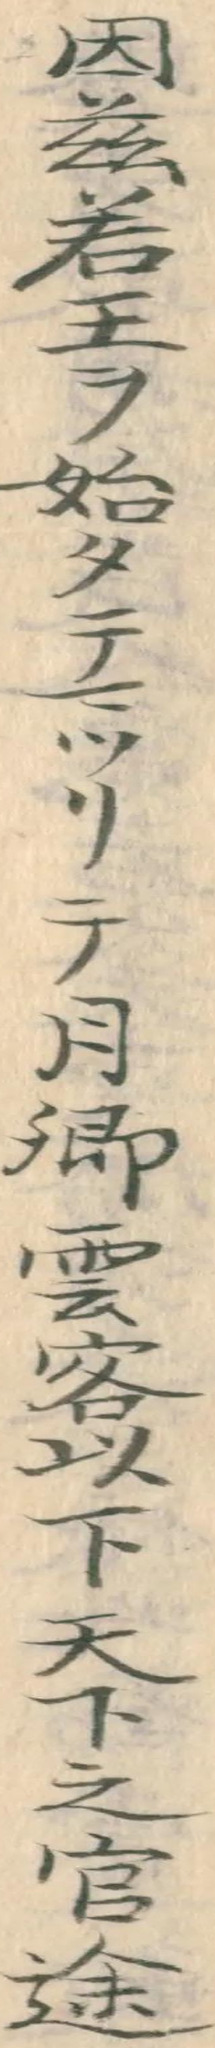因茲若王ヲ始タテマツリテ月卿雲客以下天下之官途
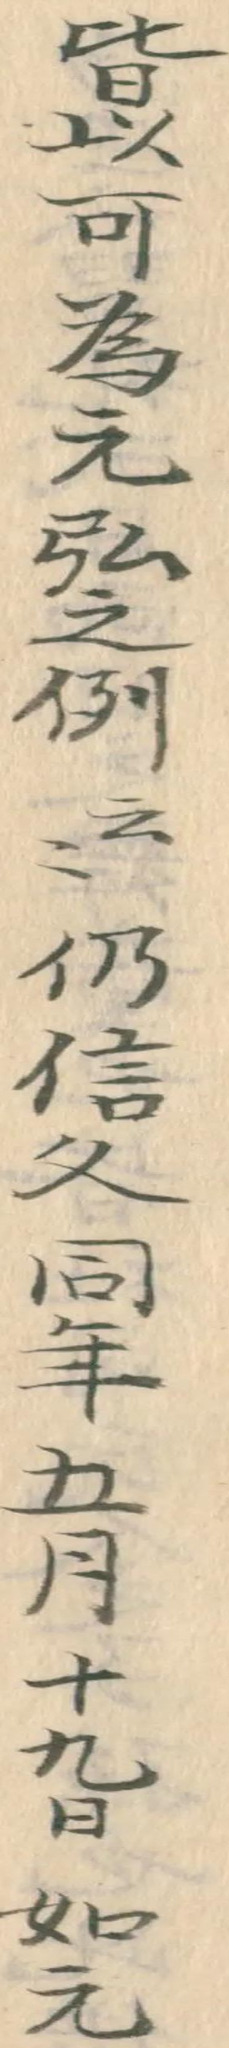皆以可為元弘之例云々仍信久同年五月十九日如元
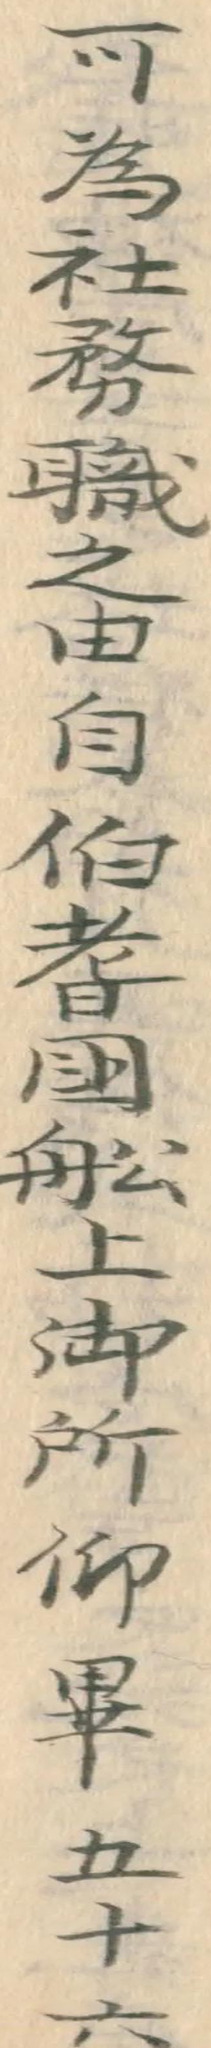可為社務職之由自伯耆国船上御所仰畢五十六
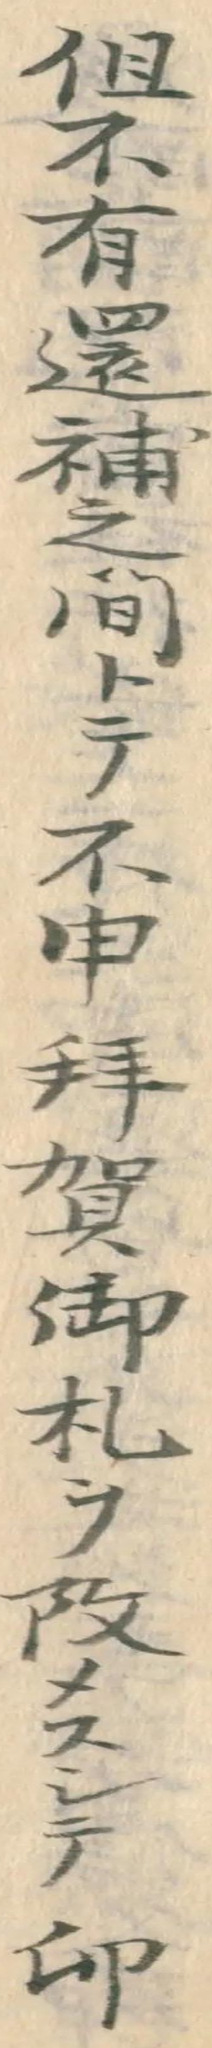但不有還補之間トテ不申拝賀御札ヲ改メスシテ印
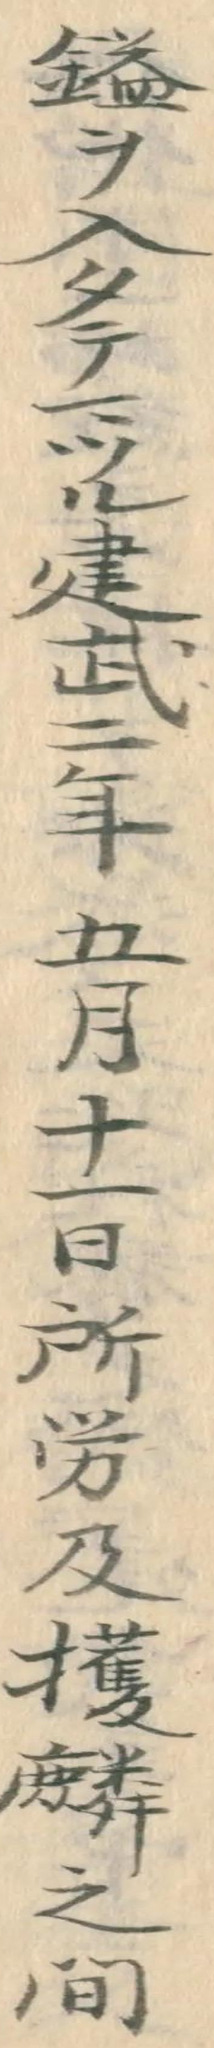鎰ヲ入タテマツル建武二年五月十一日所労及擭麟之間
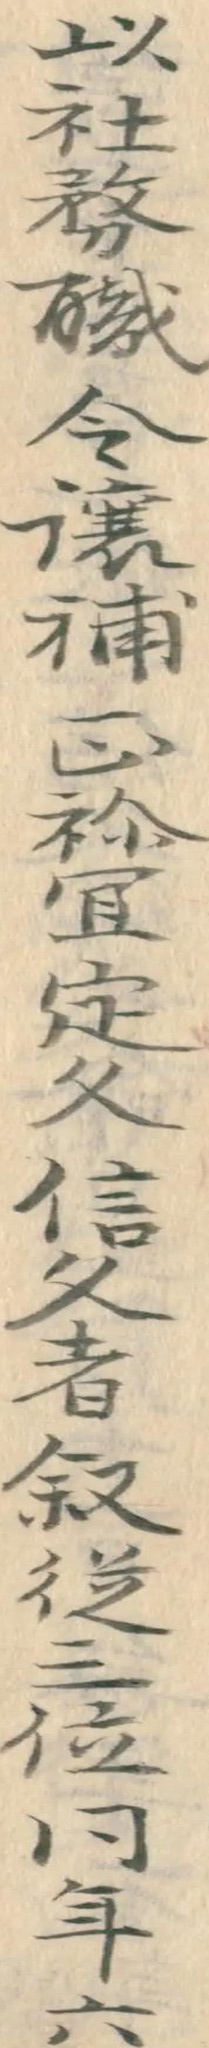以社務職令譲補正祢宜定久信久者叙従三位同年六
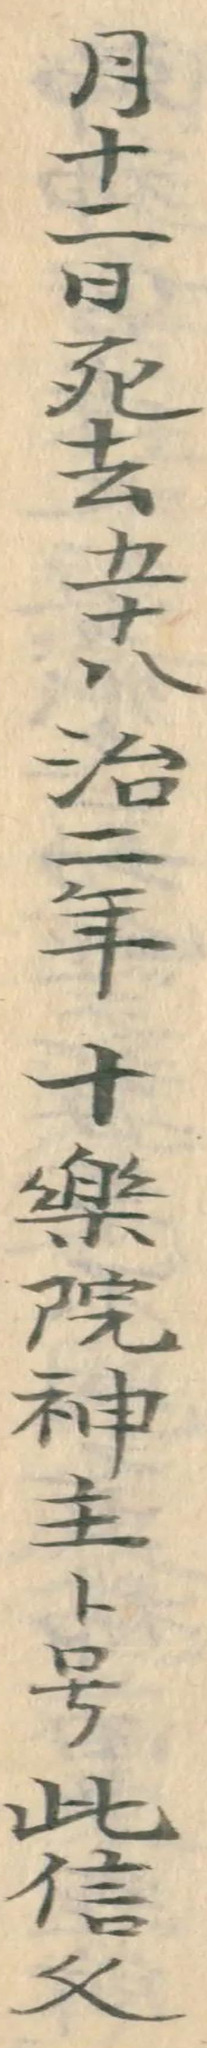月十二日死去五十八治二年十楽院神主ト号此信久

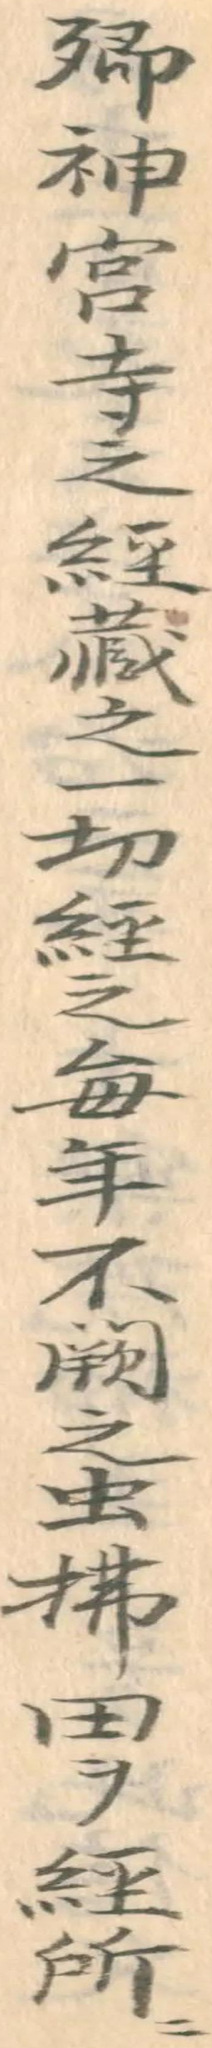卿神宮寺之経蔵之一切経之毎年不闕之虫払田ヲ経所ニ
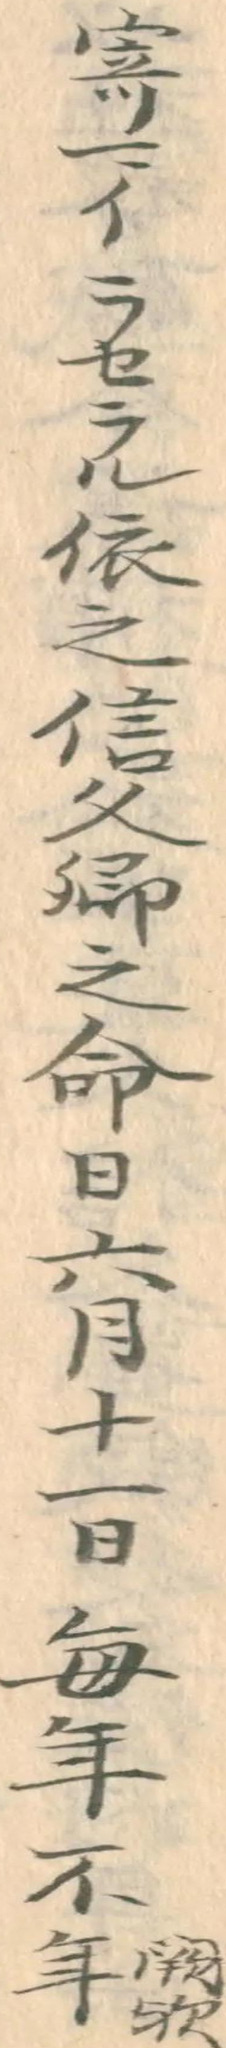寄マイラセラル依之信久卿之命日六月十一日毎年不年
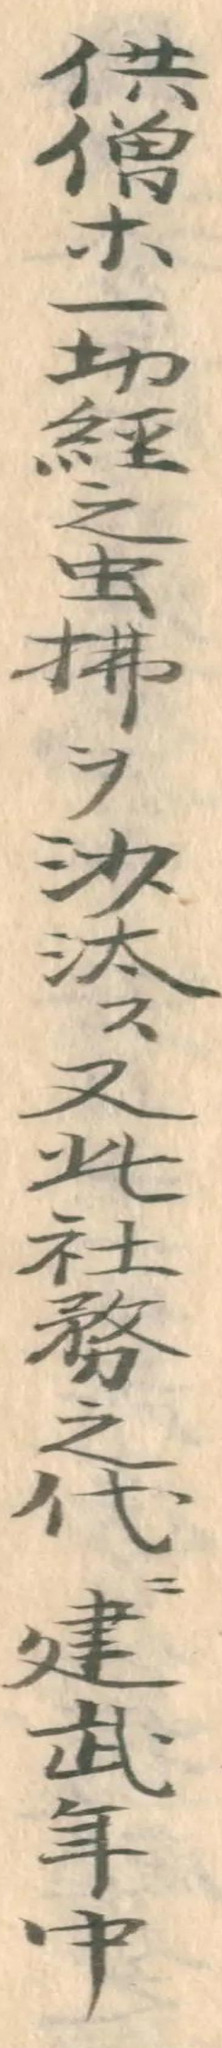供僧等一切経之虫払ヲ沙汰ス又此社務之代ニ建武年中
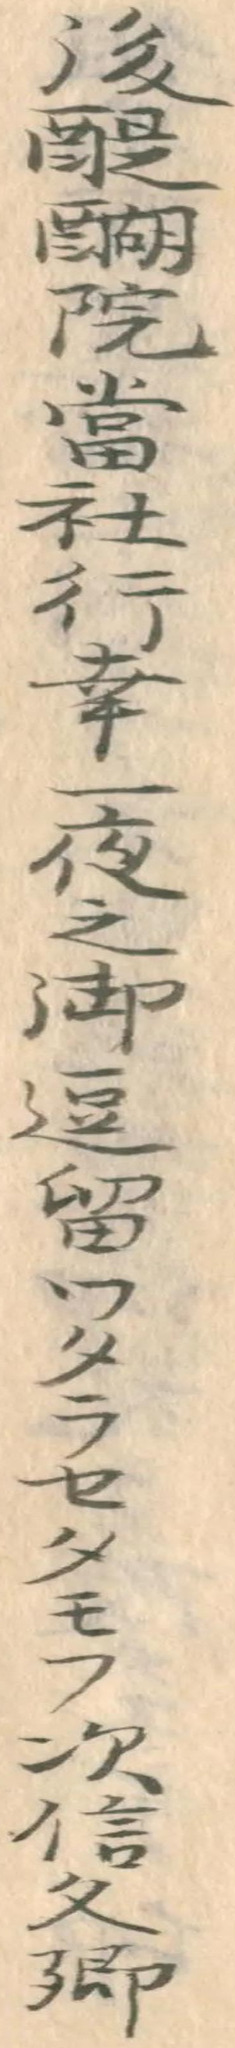後醍醐院当社行幸一夜之御逗留ワタラセタモフ次信久卿
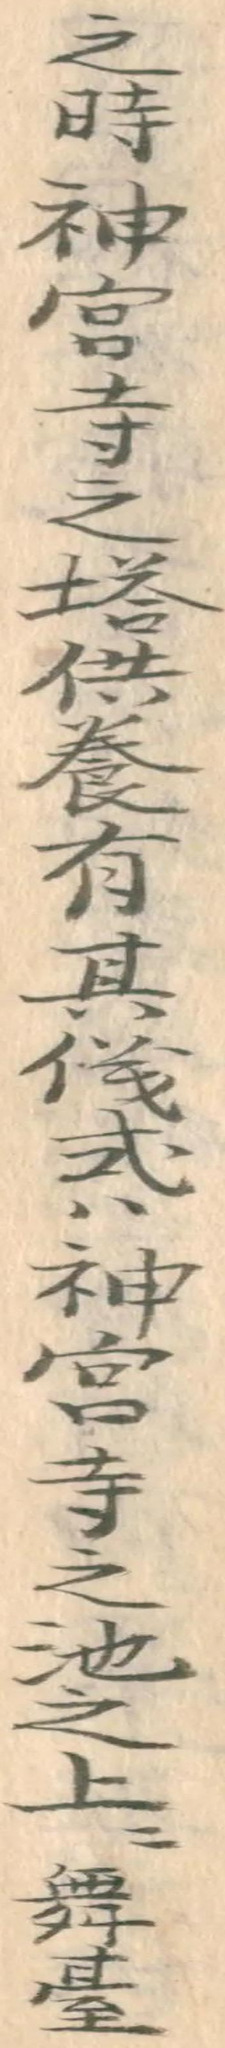之時神宮寺之塔供養有其儀式ハ神宮寺之池之上ニ舞台
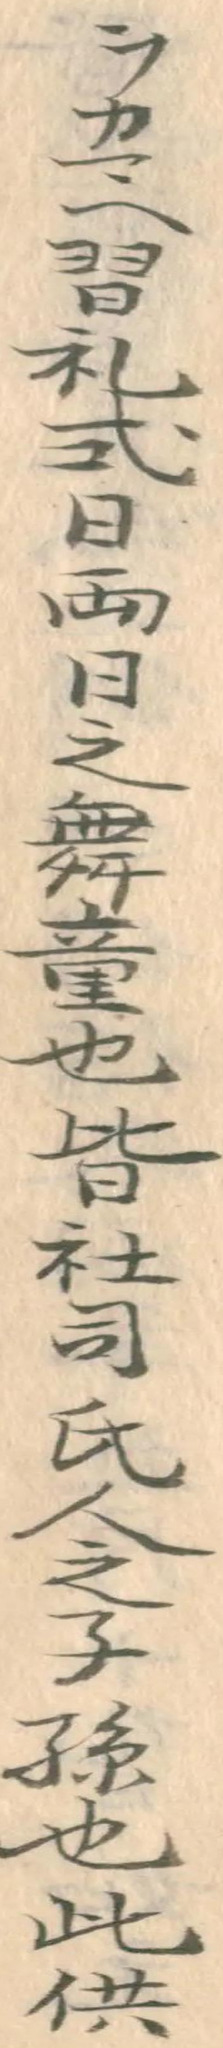ヲカマヘ習礼式日両日之舞童也皆社司氏人之子孫也此供
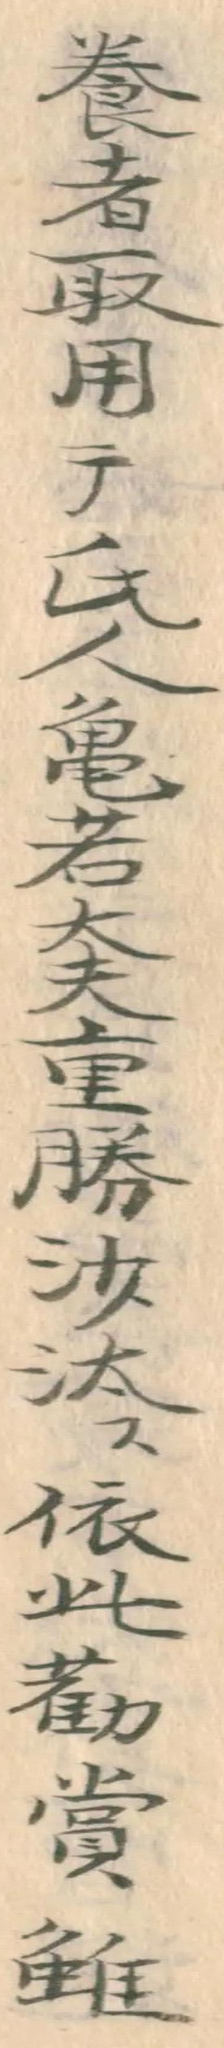養者取用テ氏人亀若大夫重勝沙汰ス依此勧賞雖
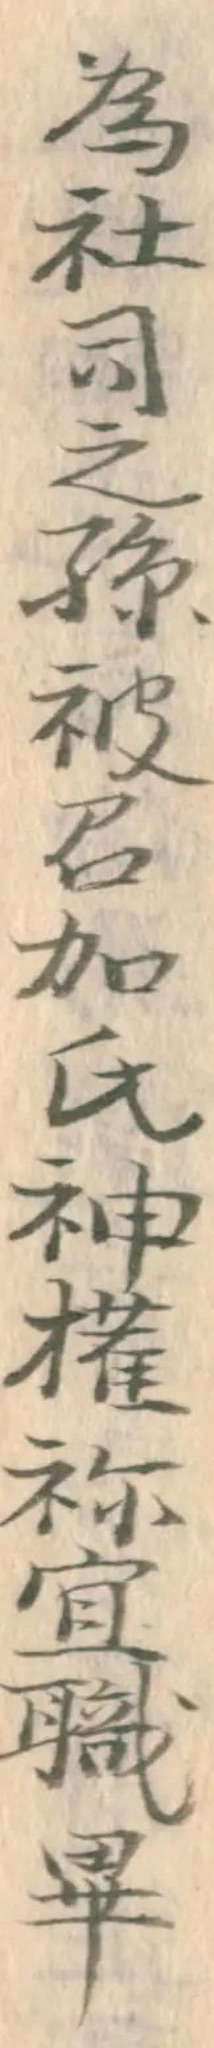為社司之孫被召加氏神権祢宜職畢
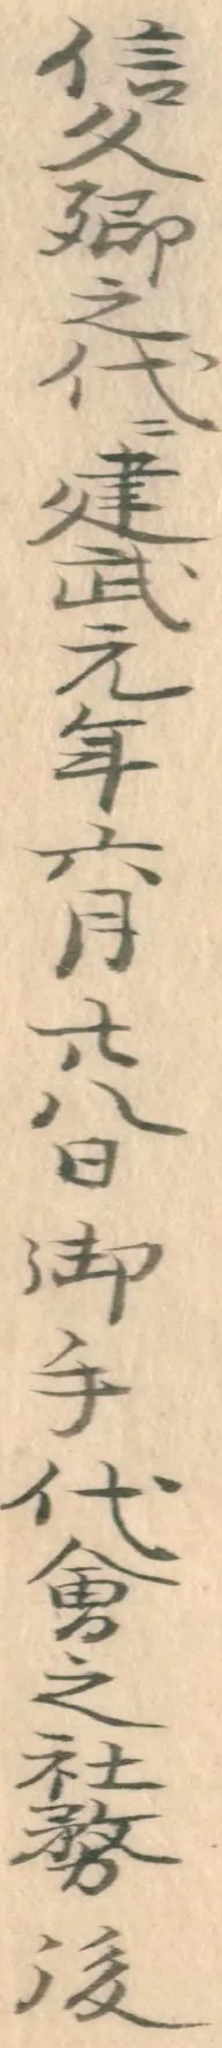信久卿之代ニ建武元年六月廿八日御手代会之社勢後
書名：賀茂社記録. 第24冊
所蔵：国立国会図書館 National Diet Library, JAPAN
